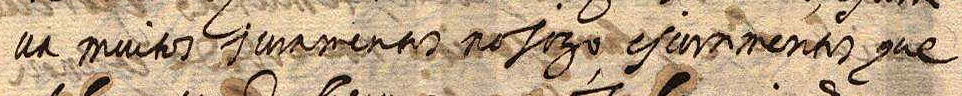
ua muitos juramentos no jogo, e juramentos que
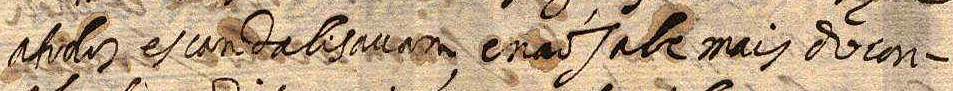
a todos escandalisauam, e naõ sabe mais do con
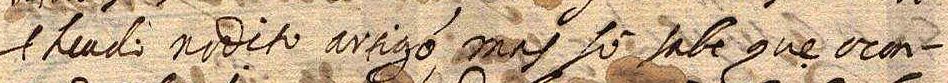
theudo no dito artigo, mas só sabe que o con
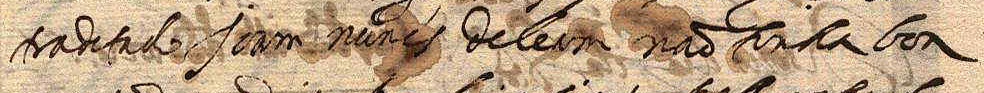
traditado Joam nunes de leam naõ tinha boa
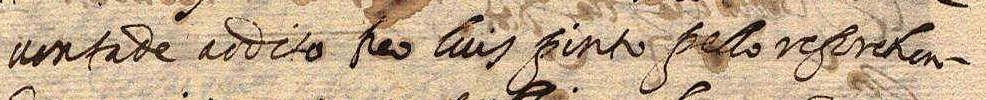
uontade ao dito Reo luis pinto pello reprehen
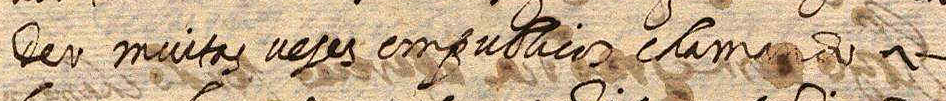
der muitas uezes em publicos chamando a
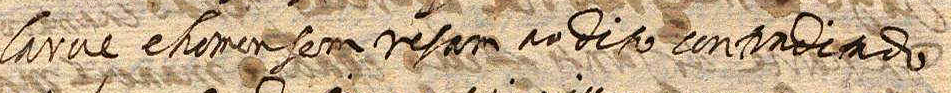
larue, e homen sem resam ao dito contraditado
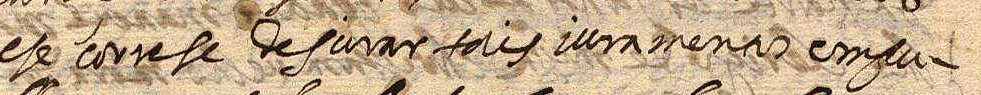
e se correse de jurar tais iuramentos em pu
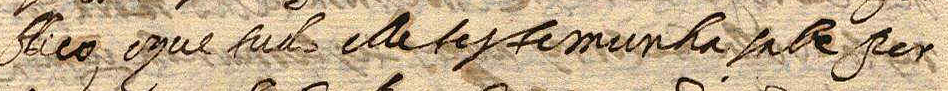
blico, o que tudo elle testemunha sabe per
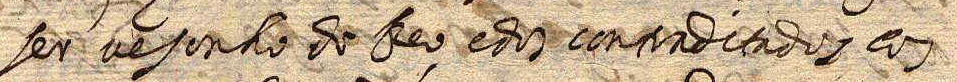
ser uesinho do Reo, e dos contraditados e os
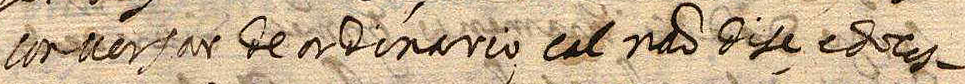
conuersar de ordinario, e al naõ dise e do cos
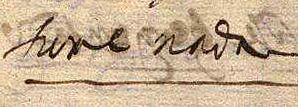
tume nada
